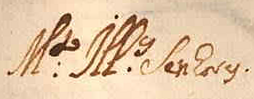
M.to Ill.es Senhores
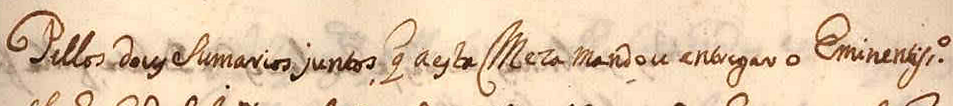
Pellos dous Sumarios juntos, q̄ a esta Meza mandou entregar o Eminentiss.o
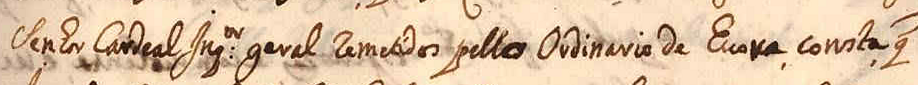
Senhor Cardeal Jnq.or geral Remetidos pello Ordinario de Euora, consta q̄
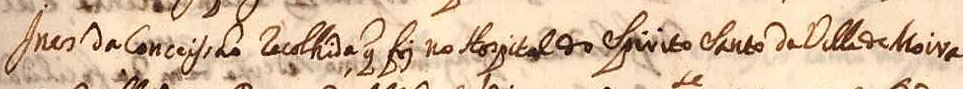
Jnes da Conceissaõ Recolhida, q̄ foj no Hospital do Spirito Santo da Villa de Moira
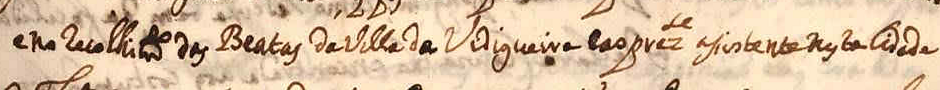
e no Recolhimto das Beatas da Villa da Vidigueira e ao prezte asistente nesta Cidade
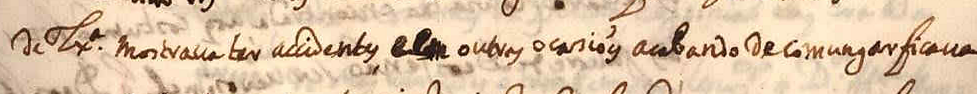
de Lx.a mostraua ter accidentes, e em outras ocazioẽs acabando de comungar ficaua
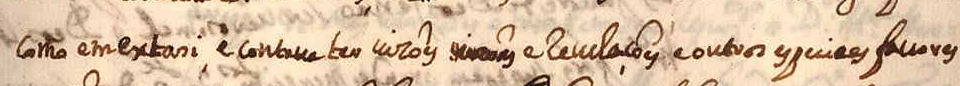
como em extasi, e contaua ter uizoẽs _as e Reuelações e outros especiaes fauores
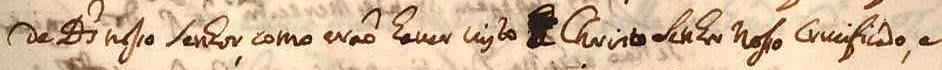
de Ds̄ nosso Senhor, como eraõ hauer uisto _ Christo Senhor nosso Crucificado, e
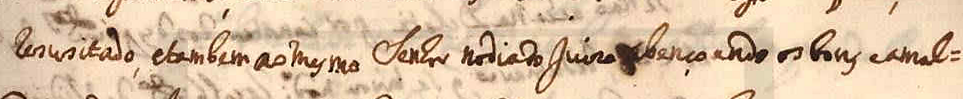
Resusitado, e tambem ao mesmo Senhor no dia do Juizo abençoando os bons e amal
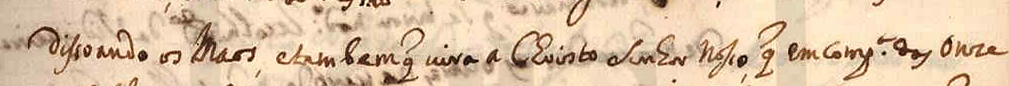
dissoando os Maos, e tambem q̄ uira a Christo Senhor nosso, q̄ em comp.a das onze
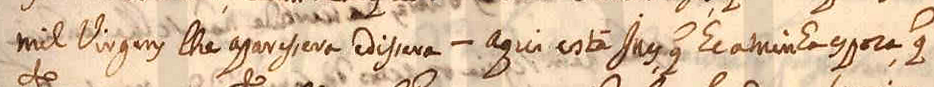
mil Virgens lhe aparessera e dissera – aqui está Jnes, q̄ he a minha espoza, q̄
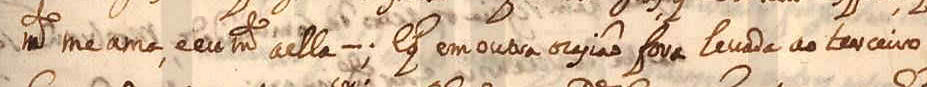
mto me ama, e eu mto a ella–; E q̄ em outra ocasiaõ fora leuada ao terceiro
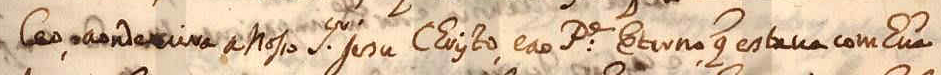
Ceo, aonde uira a Nosso S.or Jesu Christo, e ao P.e Eterno, q̄ estaua com huā
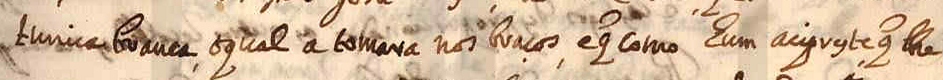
tunica branca, o qual a tomara nos braços, e q̄ como hum acipreste, q̄ lhe
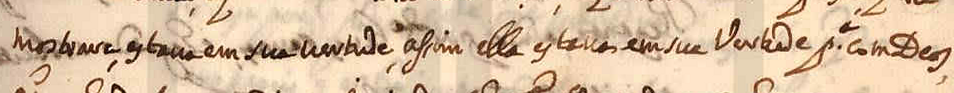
mostrara, estaua em sua uertude, assim ella estaua em sua Vertude p.a com Deos,
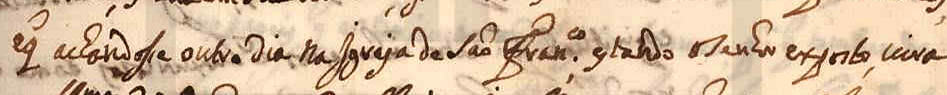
e q̄ achandosse outro dia na Jgreja de Saõ Fran.co estando o Senhor exposto, uira
